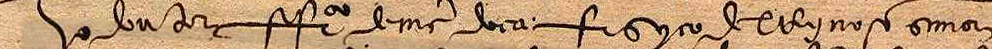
ho doutor ffrco de mēdoça fisyco del Rey noso sennor
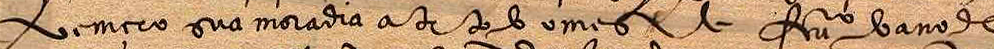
vemceo sua moradia ate todo o mes de feuro do ano de
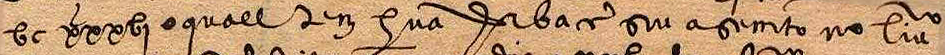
bc xxxbij o quall tem huā ꝟrba ē seu asemto no liuro
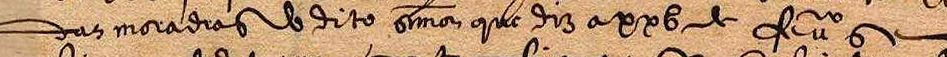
das moradias do dito sn̄nor que diz a xxb de feuro se
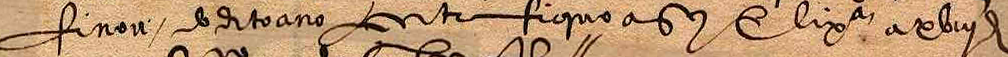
finou / do dito ano certifiquo asy ē lixa a xbiij dj
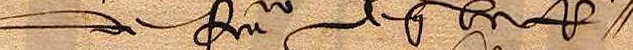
de feuro de j̄ bc R //
